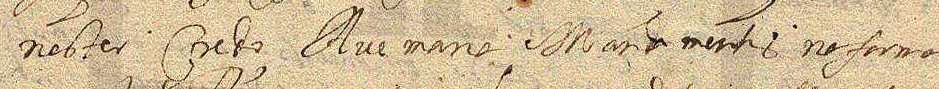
noster Credo, Aue maria e Mandamentos na forma
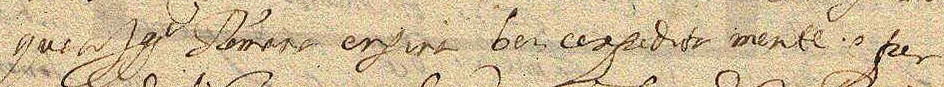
que a Jgja Romana ensina bem e expeditamente. e per
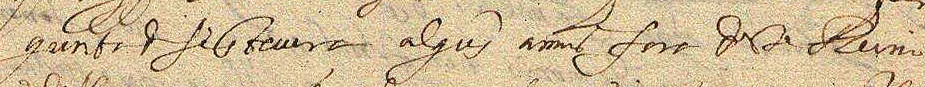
guntado se steuera algūs annos fora deste Reino
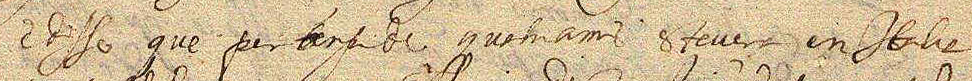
e disse que per tempo de quatro annos esteuera em Jtalia
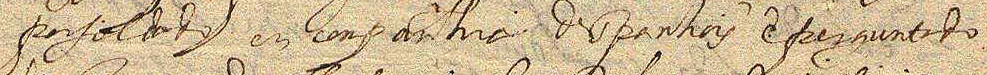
por soldado em companhia despanhois e perguntado
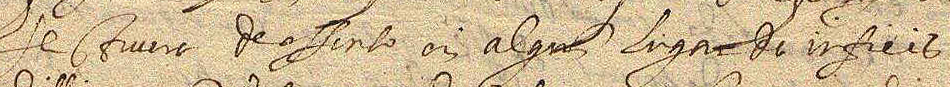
se stiuera de assento em algū lugar de infieis
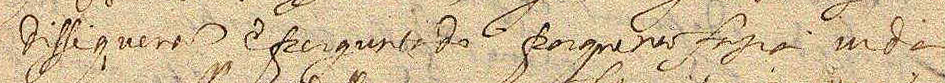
disse que naõ e perguntado porque naõ fazia uida
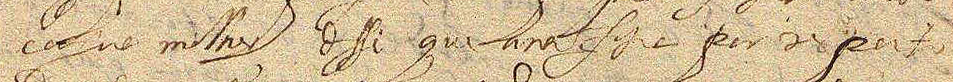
com sua molher disse que a naõ fazia por respeito
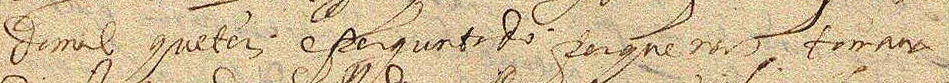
do mal que tem e perguntado porque naõ tomaua
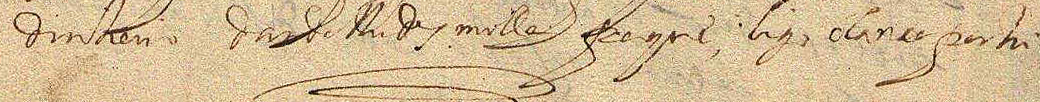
dinheiro dandolhe desmolla porque, logo o lança por hi
